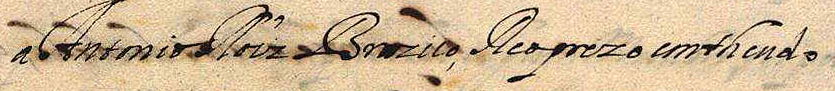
a Antonio Roiz̄ Br_zico, Reo prezo contheudo
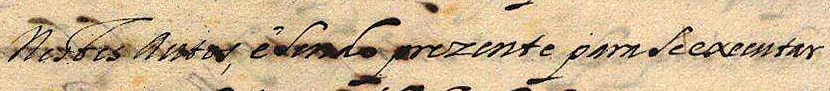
Nestes autos, e sendo prezente para se executar
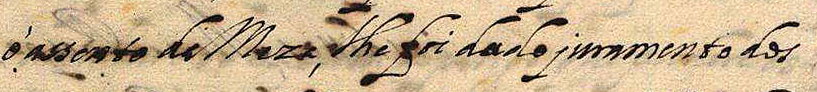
ó assento da Meza, lhe foi dado juramento dos
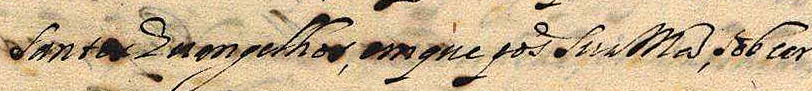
santos Euangelhos, em que pos̄ sua Mā, sob car
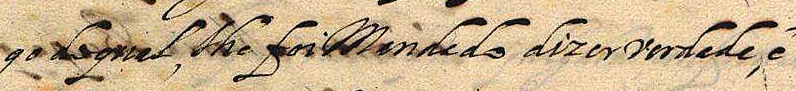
go do qual, lhe foi Mandado dizer verdade, e
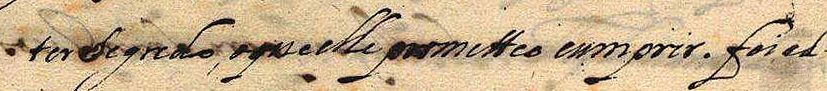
ter segredo, o que elle prometteo cumprir. foi ad
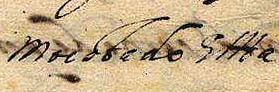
moestado Ettta
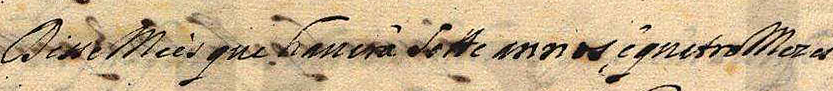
Disse Mais que hauerá sette annos, e quatro Mezes
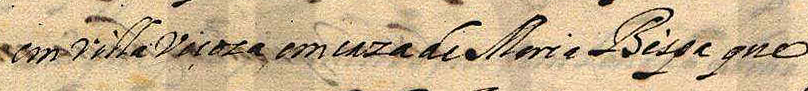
em villa Viçoza, em caza de Maria Bispa que
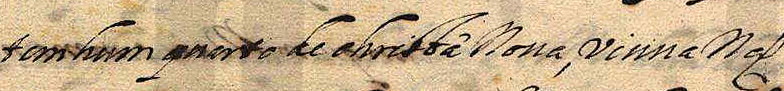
tem hum quarto de christā Noua, viuua Naõ
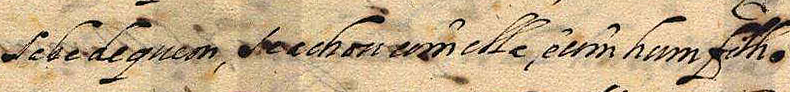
sabe de quem, se achou com̄ ella, e com̄ hum filho
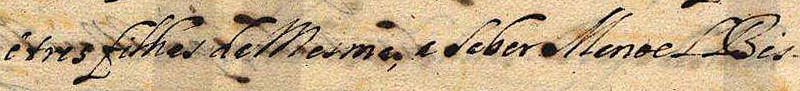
e tres filhas da Mesma, a Saber ManoeL Bis
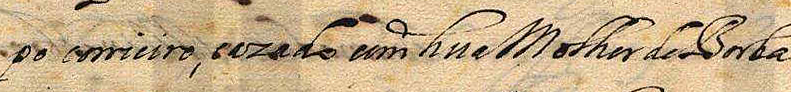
po corrieiro, cazado com̄ hua Molher de Borba
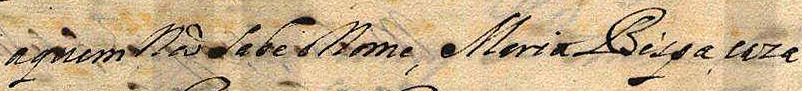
a quem Naõ sabe o Nome, Maria Bispa, caza
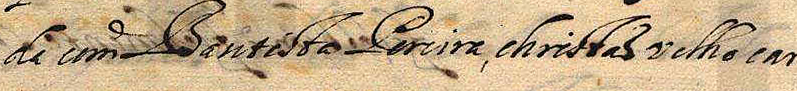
da com̄ Bautista Pereira, christaõ velho car
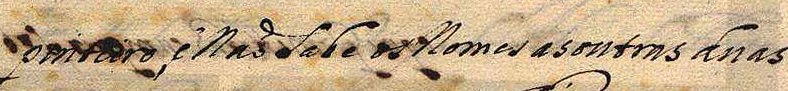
pinteiro, e Naõ Sabe os Nomes as outras duas
